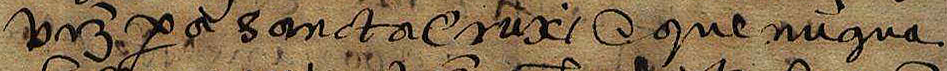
vez ꝑa sancta Crux / e que nūqua
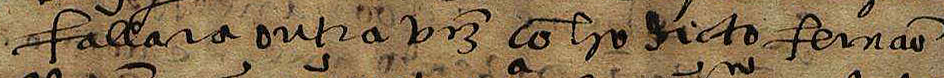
fallara outra vez cō ho dicto fernaõ
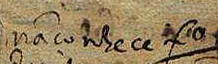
nā conhece fo
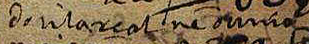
do uila real nē ouuio
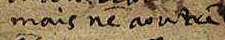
mais nē a outrē
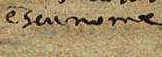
ē seu nome
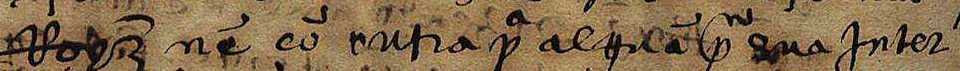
Royz̄ nē cō outra pa alguā p̄o sua Jnter
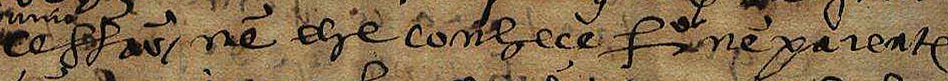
cessaõ, nē lhe conhece fo nē parente
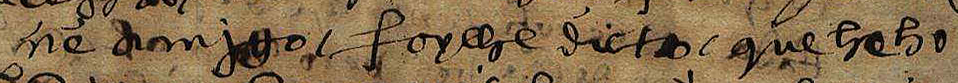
nē amjgo / foylhe dicto / que he ho
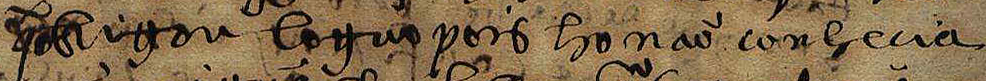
q̄ obrigou loguo pois ho naõ conhecia
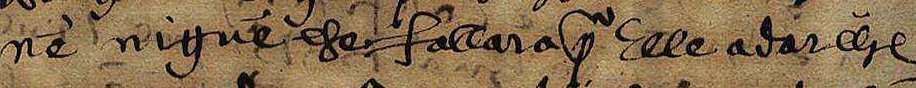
nē niguē lhe fallara p̄o Elle a darlhe
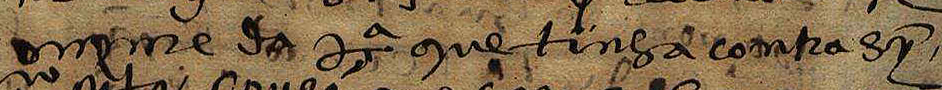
o nome da ta que tinha contra sȳ,
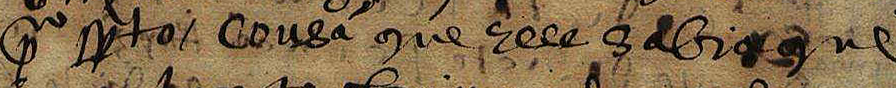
p̄o sp̄to / cousa que Elle sabia que
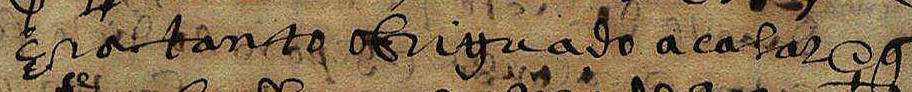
Era tanto obriguado a calar e q̄
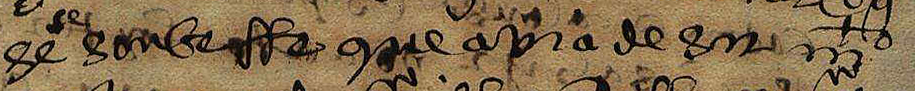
se soubesse que avia de ser mto
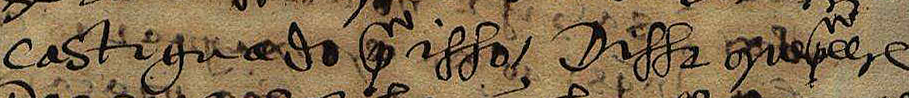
castiguado p̄o isso / Disse que p̄o lhe
